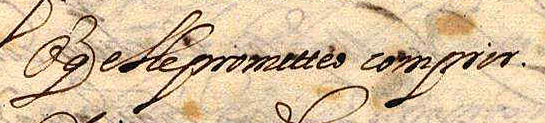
O q̄ elle prometteo comprir.
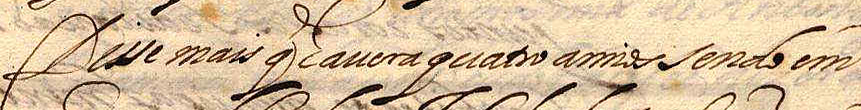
Disse mais q̄ hauera quatro annos sendo em
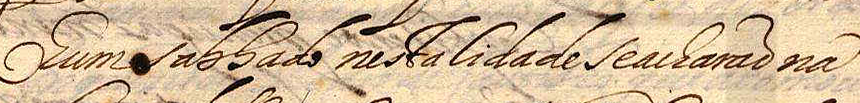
hum sabbado nesta Cidade se acharaõ na
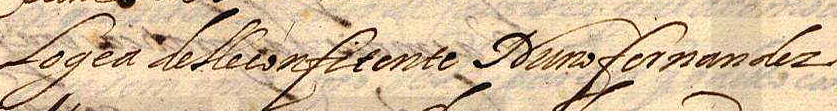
Logea delle confitente Nuno fernandez
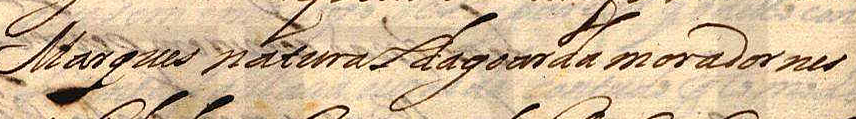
Marques natural da goarda morador nes
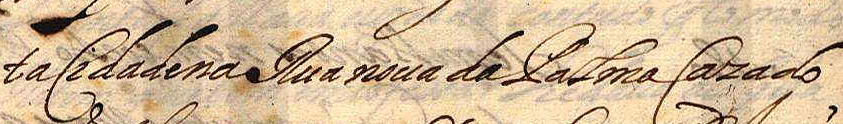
ta Cidade na Rua noua da Palma Cazado
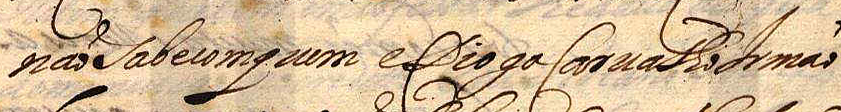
naõ sabe com quem, e Diogo Carualho Irmaõ
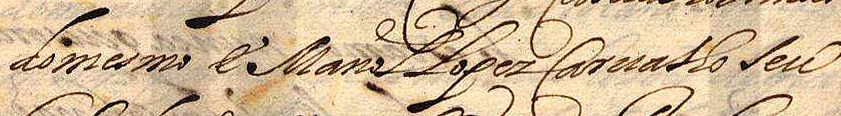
do mesmo e Manoel Lopez Carualho seu
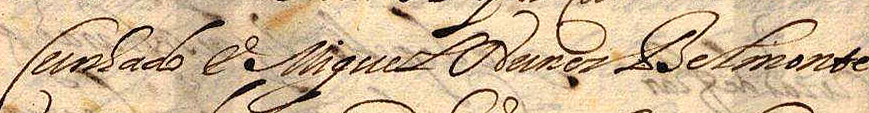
Cunhado e Miguel Nunez Belmonte
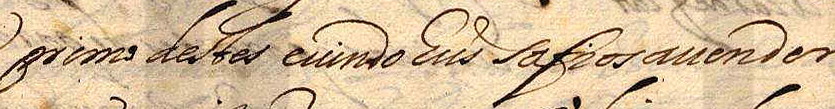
primo destes e uindo hūs safios a uender
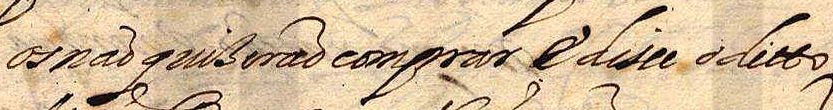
os não quizerão comprar e disse o ditto
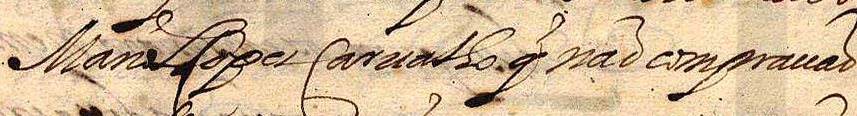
Manoel Lopez Carualho q̄ naõ comprauaõ
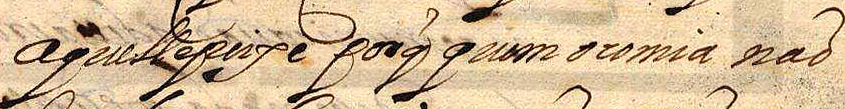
aquelle peixe porq̄ quem o comia naõ
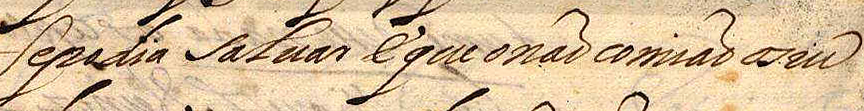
se podia saluar e que o naõ comião os iu
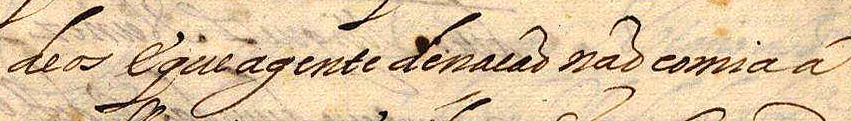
deos E que a gente de nação naõ comia a
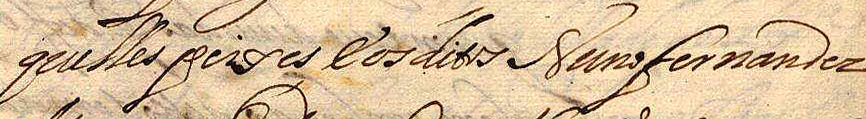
quelles peixes, e os ditos Nuno fernandez
